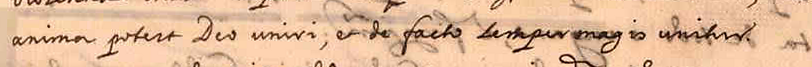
anima potest Deo uniri, et de facto semper magis unitur.
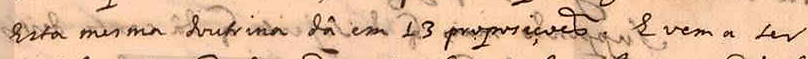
Esta mesma doutrina dâ em 13 proposiçoẽs, E vem a ser
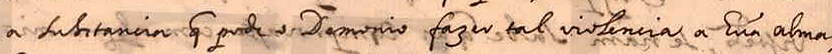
a substancia q̄ pode o Demonio fazer tal violencia a huā alma
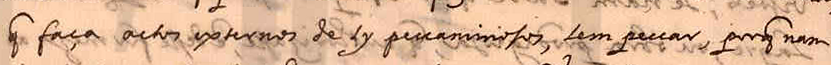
q̄ faça actos externos de sy peccaminosos, sem peccar, porq̄ nam
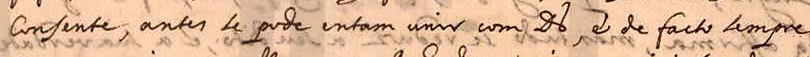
consente, antes se pode entam unir com Ds̄, e de facto sempre
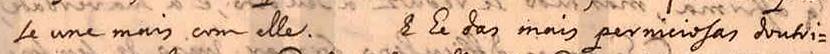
se une mais com elle. E he das mais perniciosas doutri
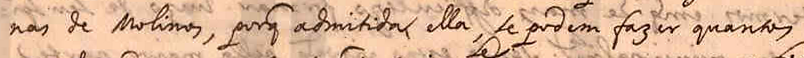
nas de Molinos, porq̄ admitida ella, se podem fazer quantos
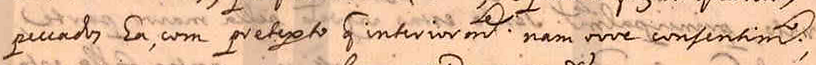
peccados ha, com pretexto q̄ interiorm.te nam ouve consentim.to
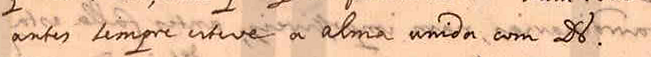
antes sempre esteve a alma unida com Ds̄.
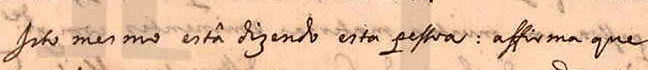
Jsto mesmo estâ dizendo esta pessoa: affirma que
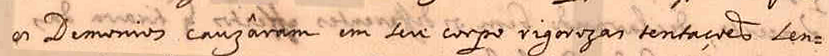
os Demonios cauzâram em seu corpo rigorozas tentaçoẽs sen
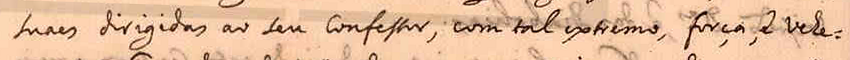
suaes dirigidas ao seu Confessor, com tal extremo, força, e vehe
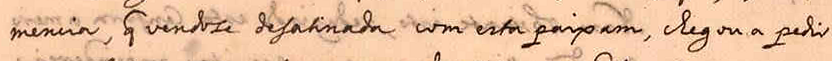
mencia, q̄ vendose desatinada com esta paixam, chegou a pedir
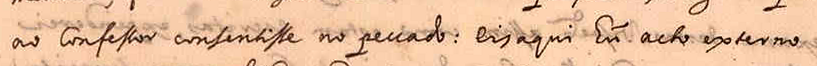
ao Confessor consentisse no peccado: eis aqui hū acto externo
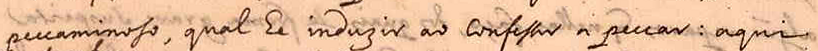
peccaminoso, qual he induzir ao Confessor a peccar: aqui
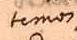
temos
